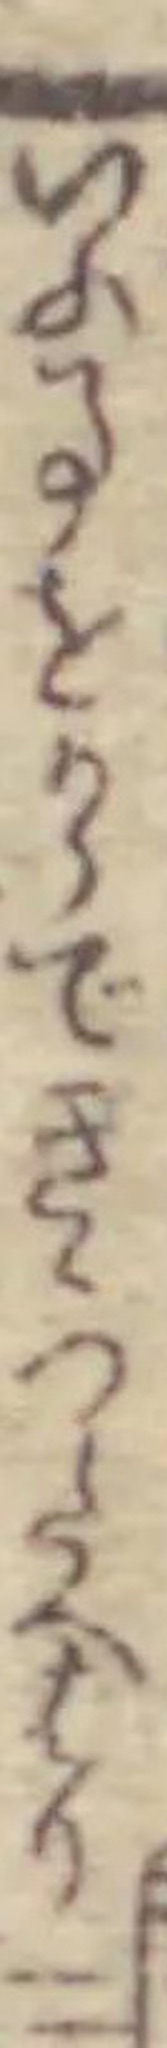いふ事をからできゝつたへはり
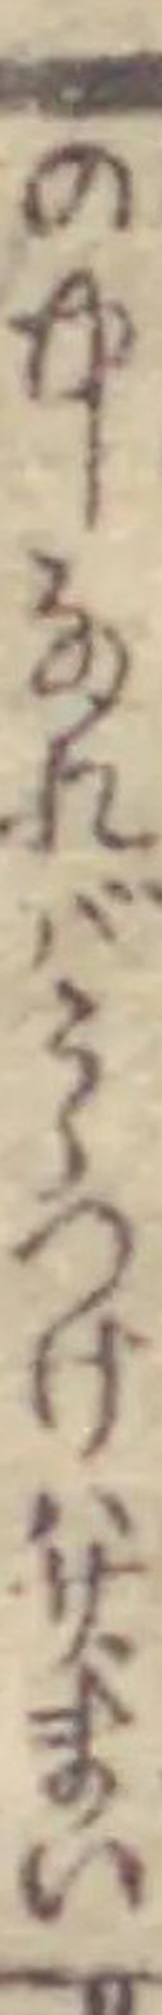の中なればうらつけは廿まい
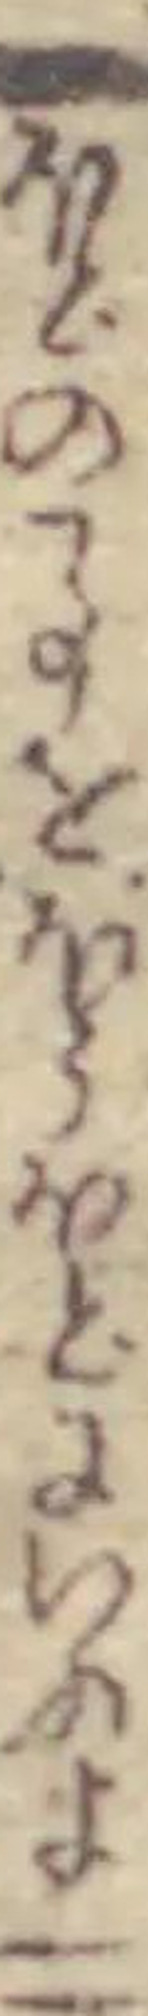ほどの事をぼうほどにいふよ
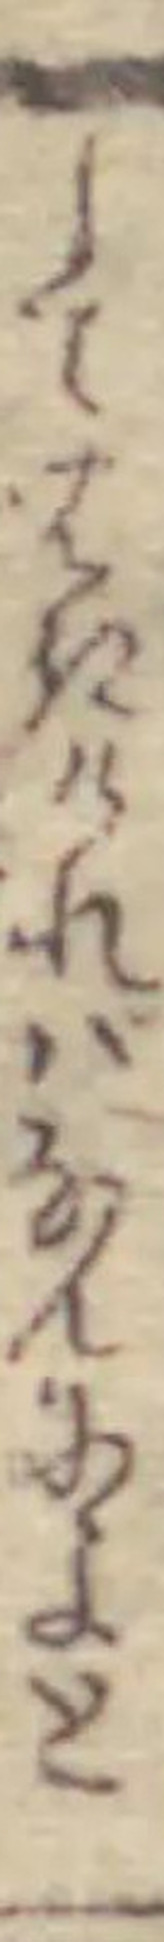してはきければなんによと
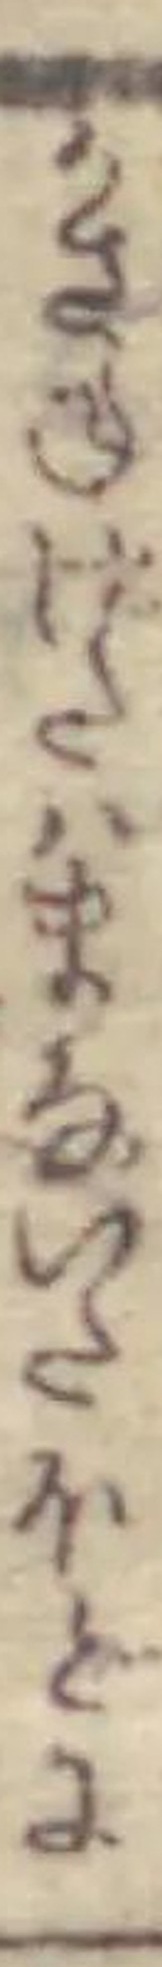かさねげたはまないたほどに
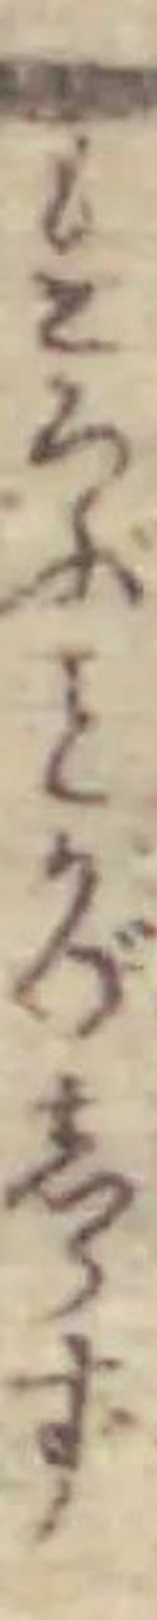もころぶことかづしらず
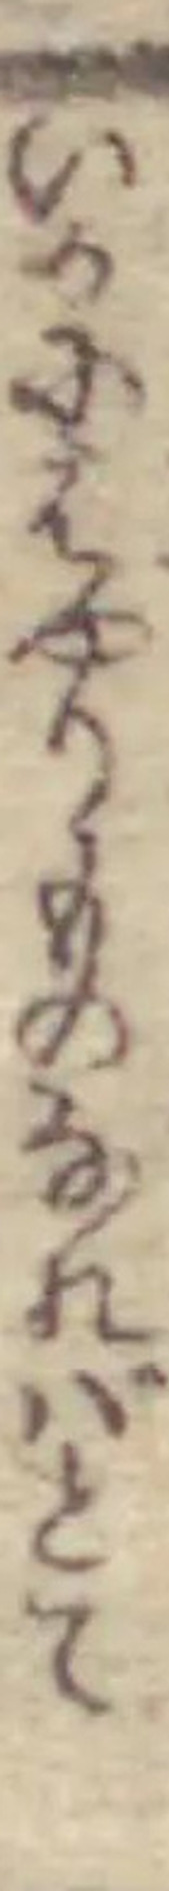いかにはやりものなればとて
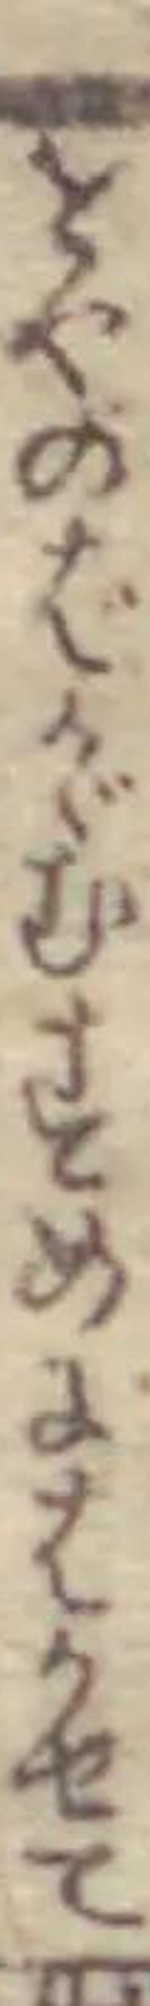をやのばかゞむすめにはかせて
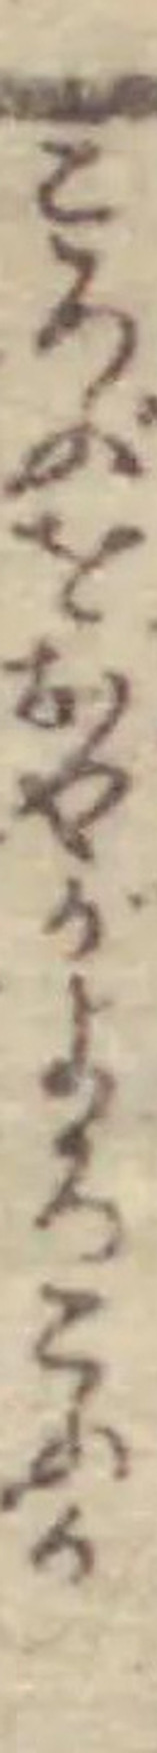ころぶをおやがよろこふか
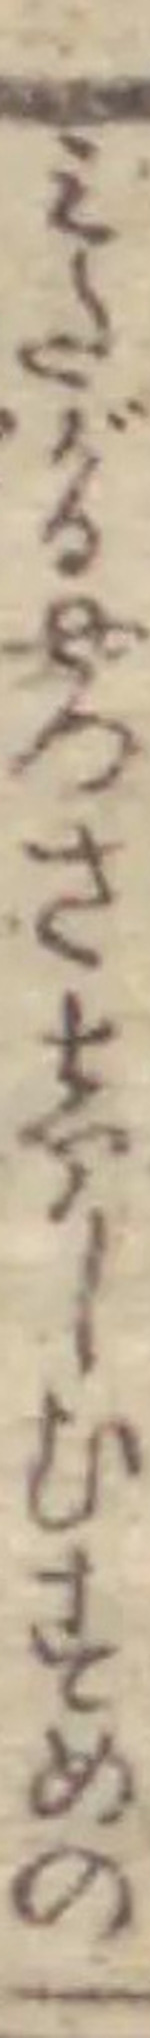みたがるやつさしかしむすめの
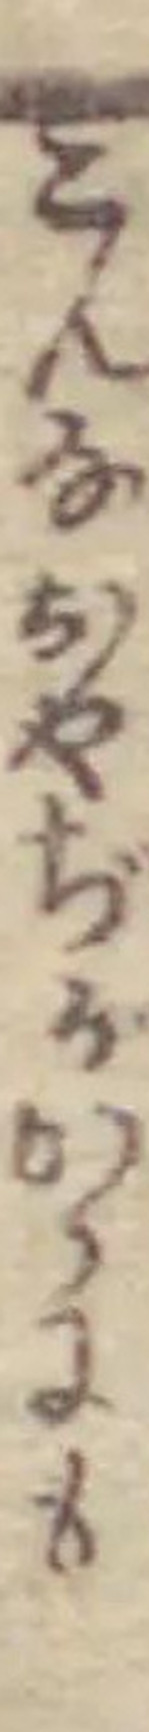こんなおやじがからにも
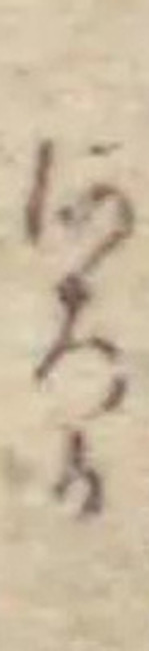あろか

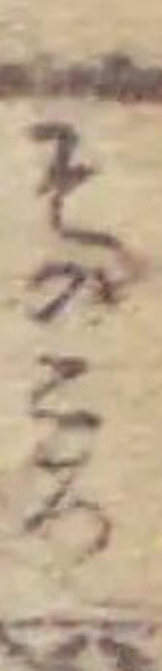そのころ
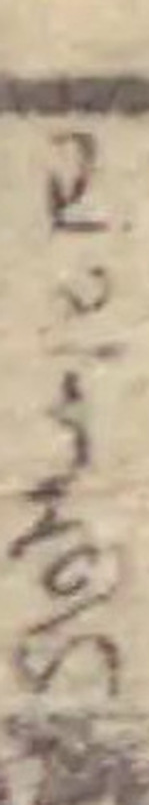わとうない
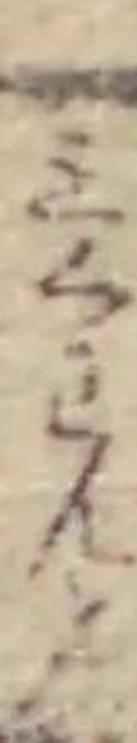三くわんと
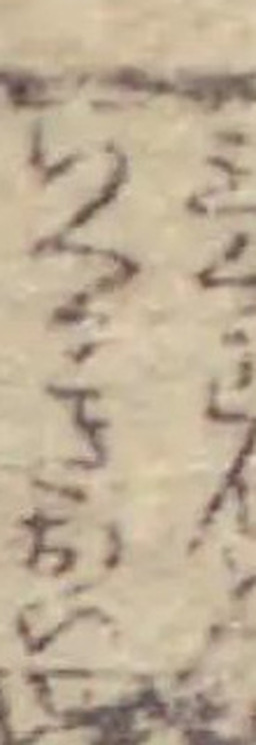いへるきおい
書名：茶羅毛通人 3巻
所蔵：国立国会図書館 National Diet Library, JAPAN
